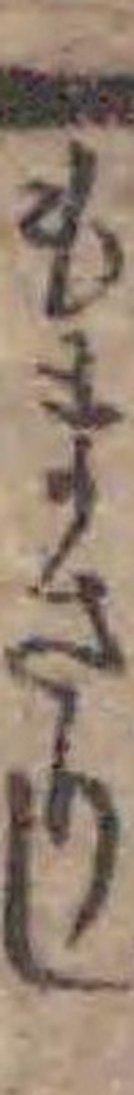もまさりし
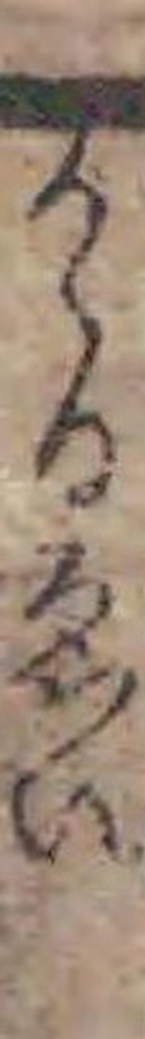かゝるゑい
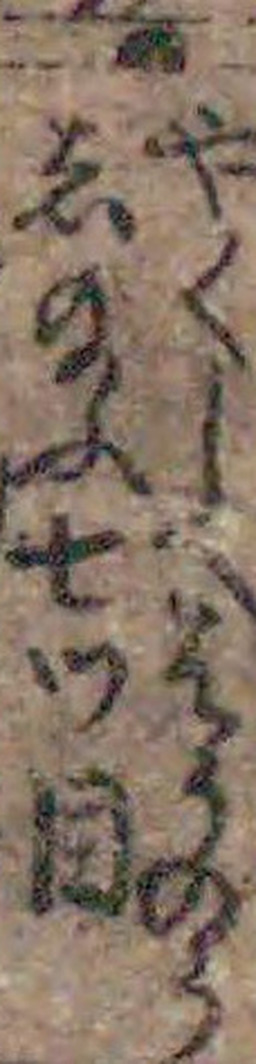し給ふ七つ目
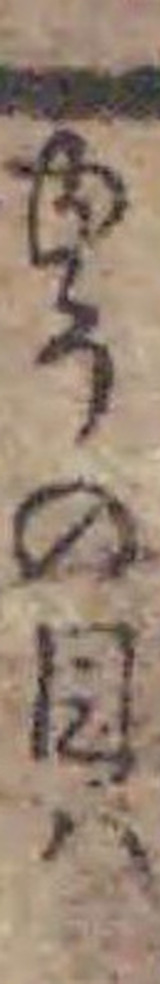ゆうの目は
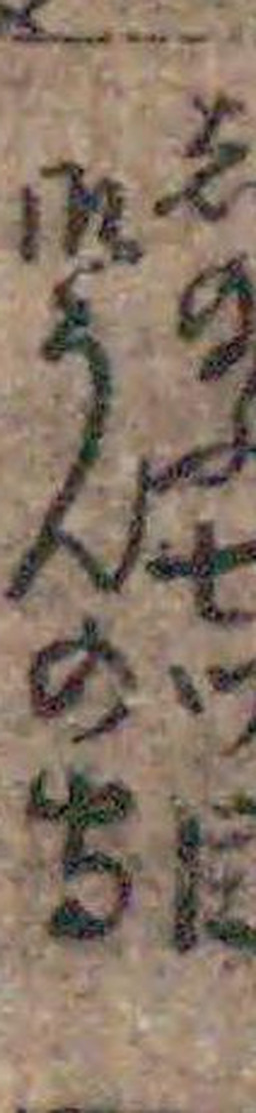御うんの守
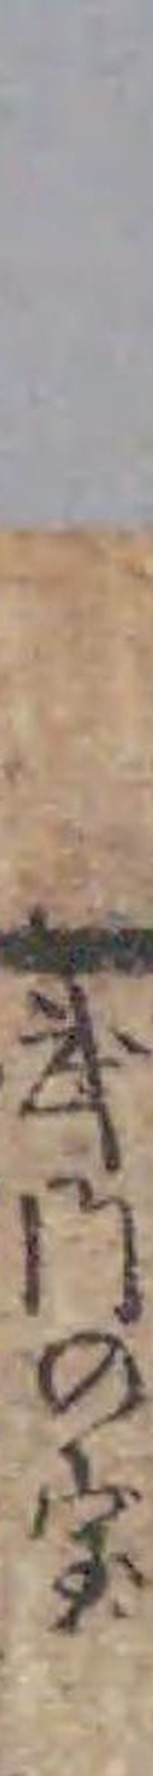武門の宝
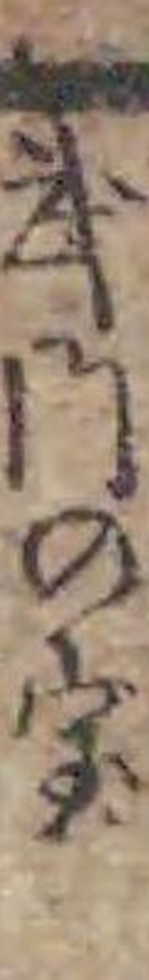武門の宝
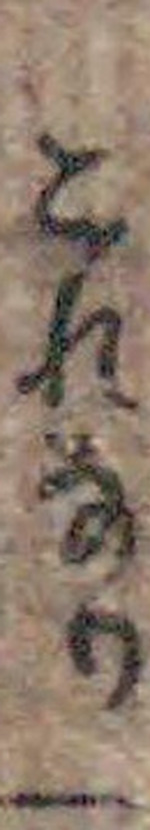これなり
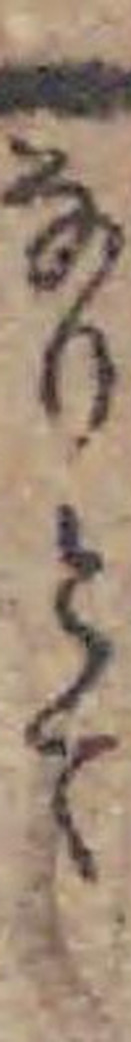なりとて
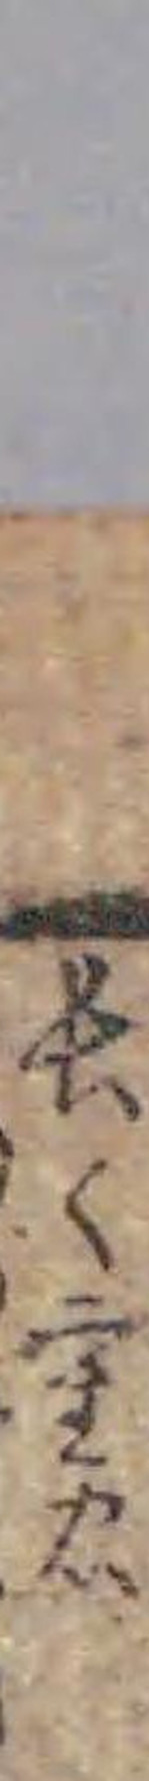長く重忠
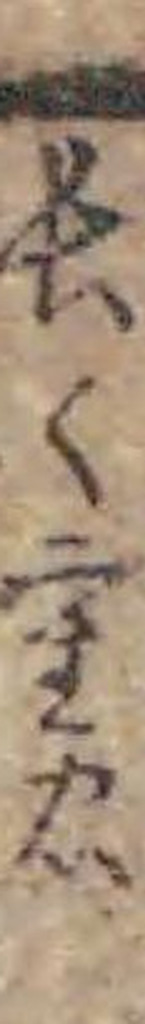長く重忠
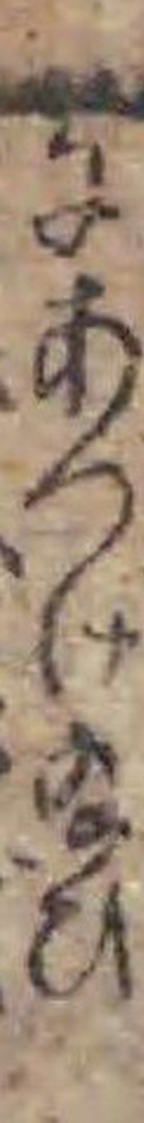にあづけ給ひ
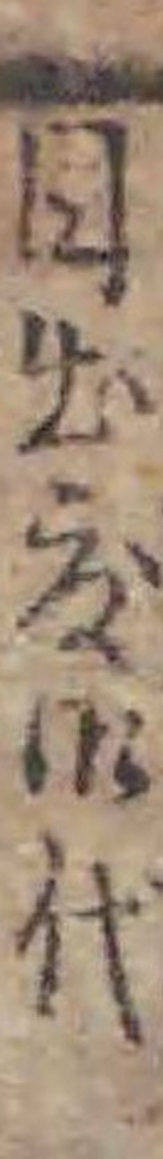目出度御代
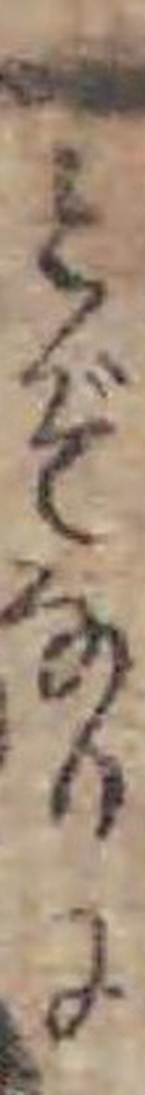とぞなりに
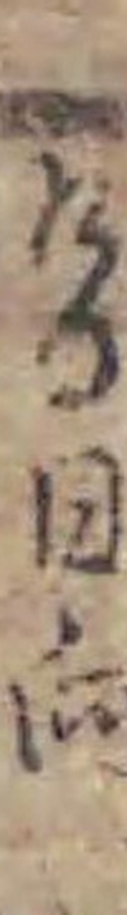ける日向
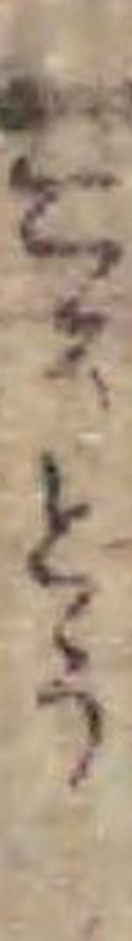こうとう
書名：悪七変目景清 : 2巻
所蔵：国立国会図書館 National Diet Library, JAPAN
